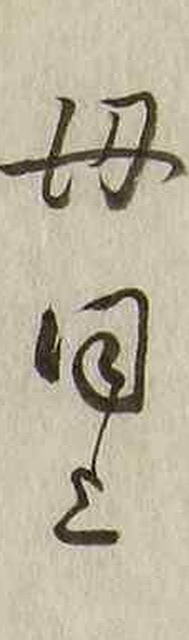母同上
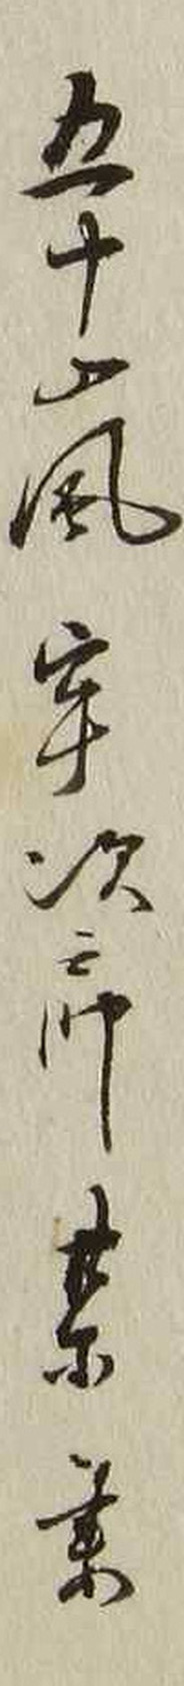女五十嵐宇次郎某妻
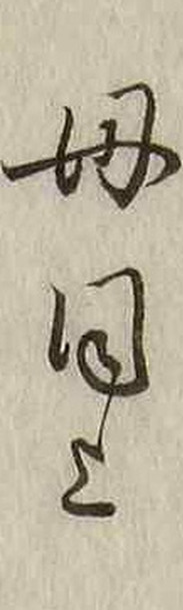母同上
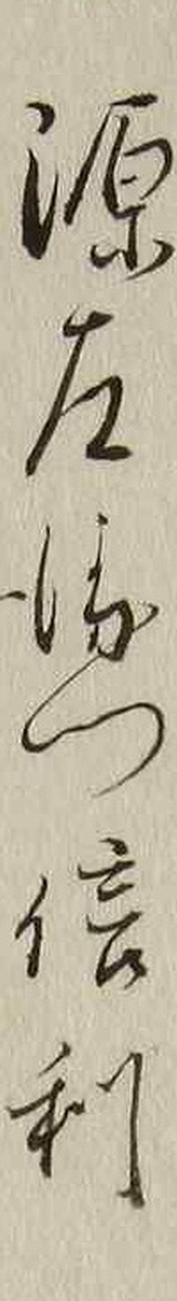源左衛門信利
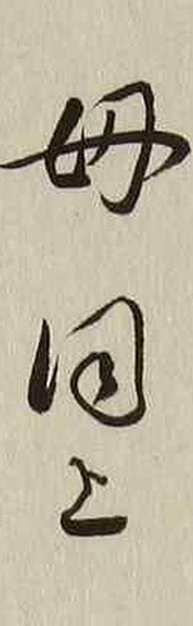母同上
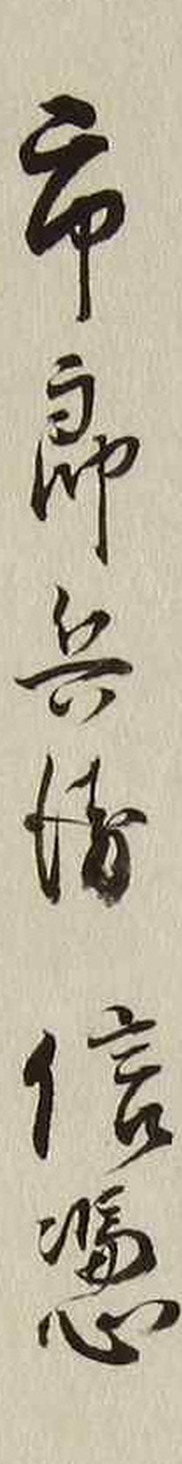市郎兵衛信憑
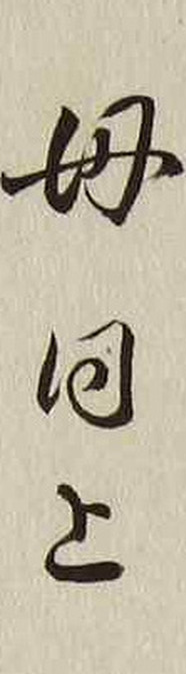母同上
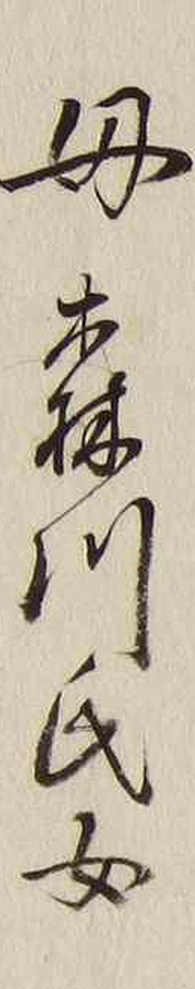母森川氏女

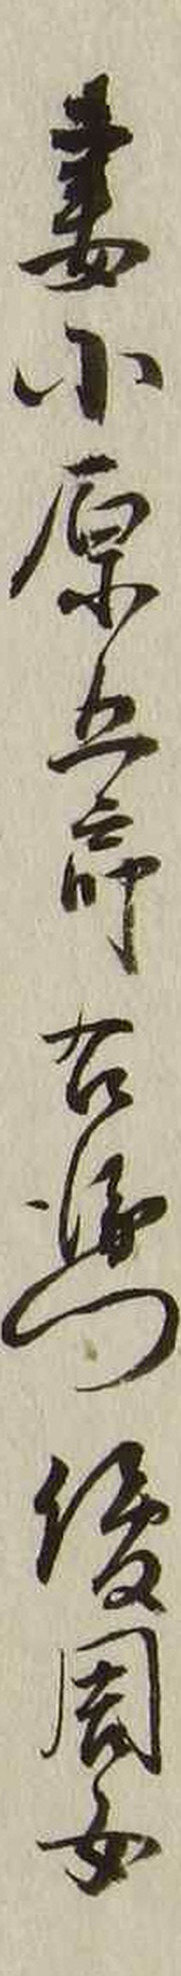妻小原五郎右衛門俊周女
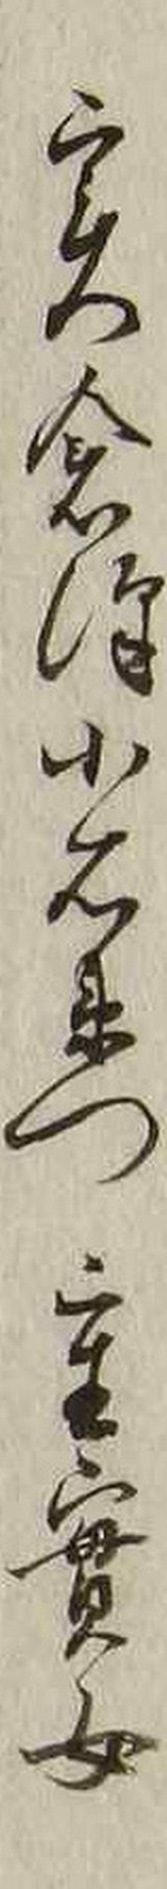実倉津小右衛門重実女
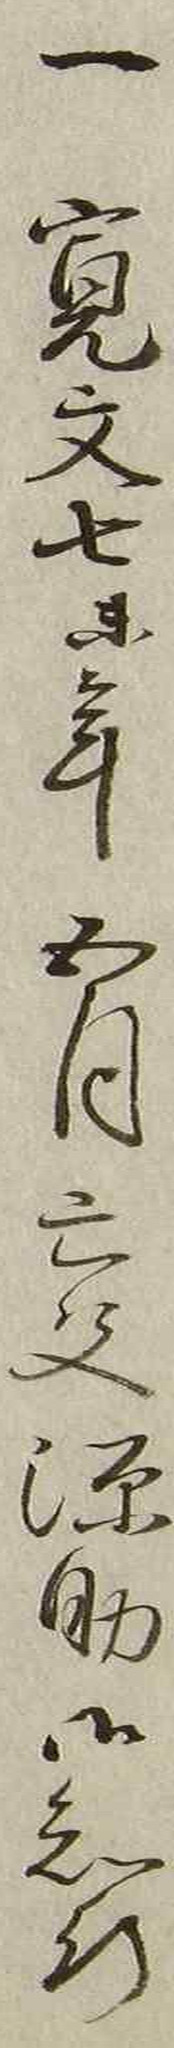一寛文七未年五月亡父源助御知行
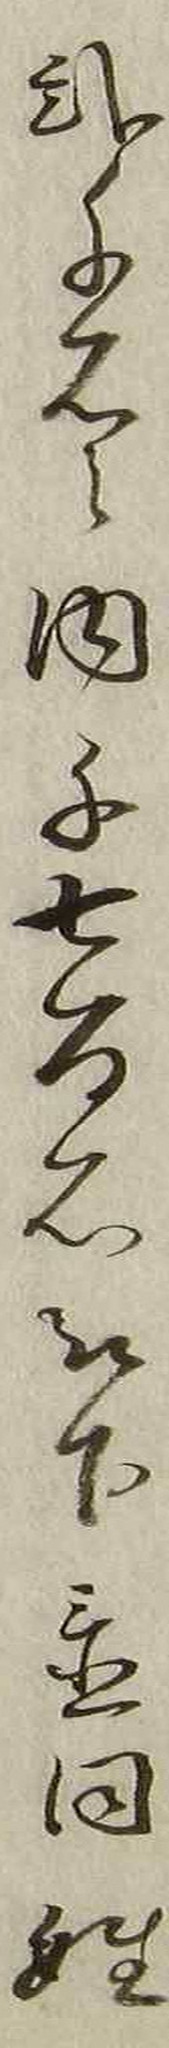弐千石之内千七百石被下置同姓
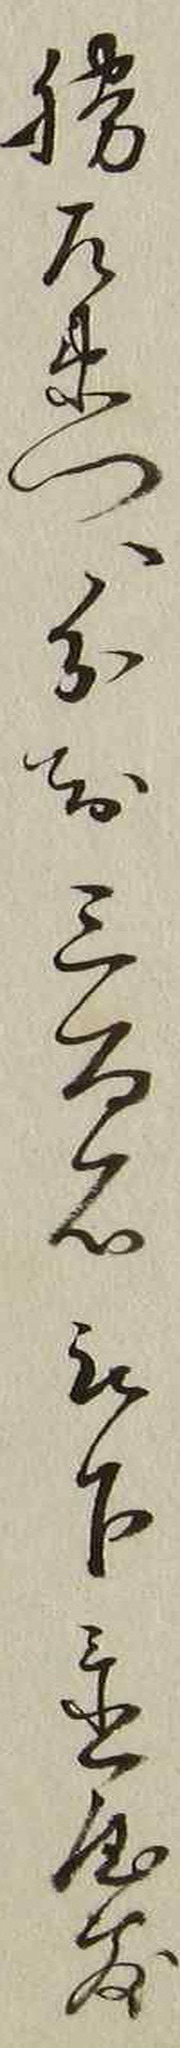勝左衛門へ分知三百石被下置屋敷
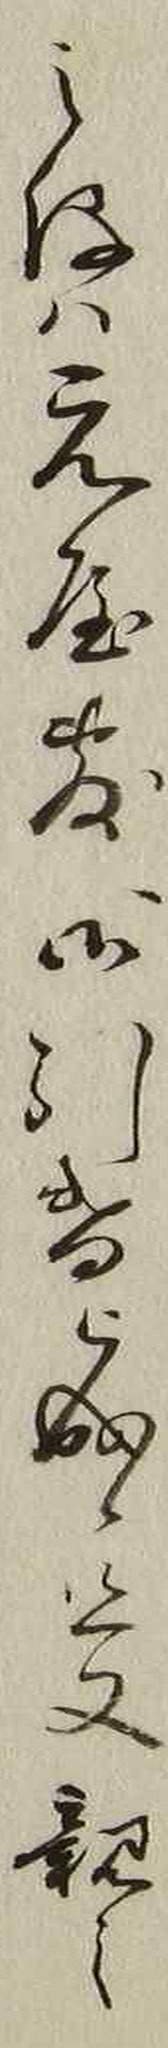之儀は元屋敷に御引替成候且又親之
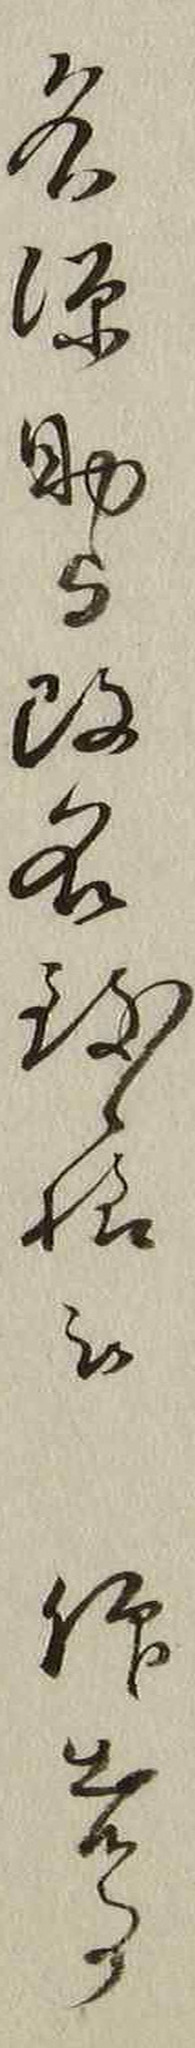名源助と改名致候様被仰出候事
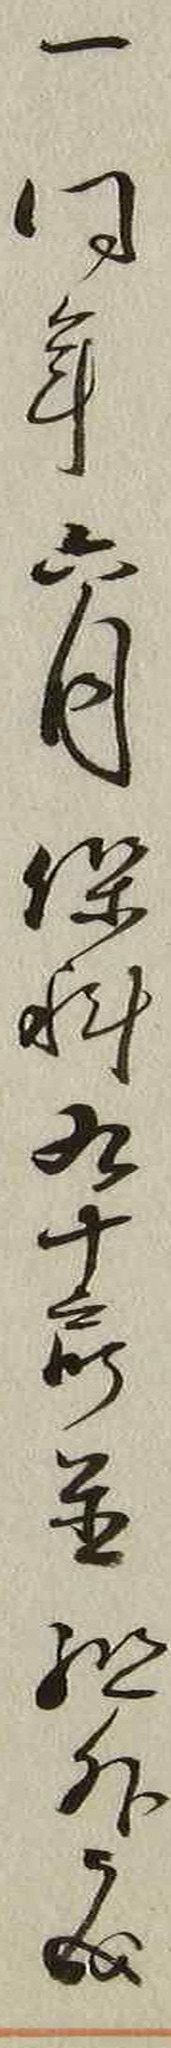一同年六月保科九十郎並組外被成
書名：諸士系譜　巻之159　な之部1
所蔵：会津若松市立会津図書館
